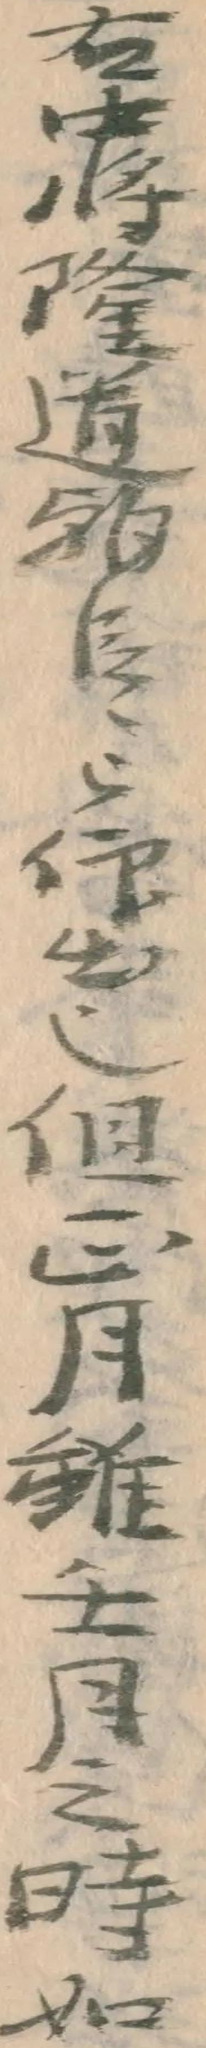右中将隆道朝臣へ被仰出也但正月雖壬月之時如
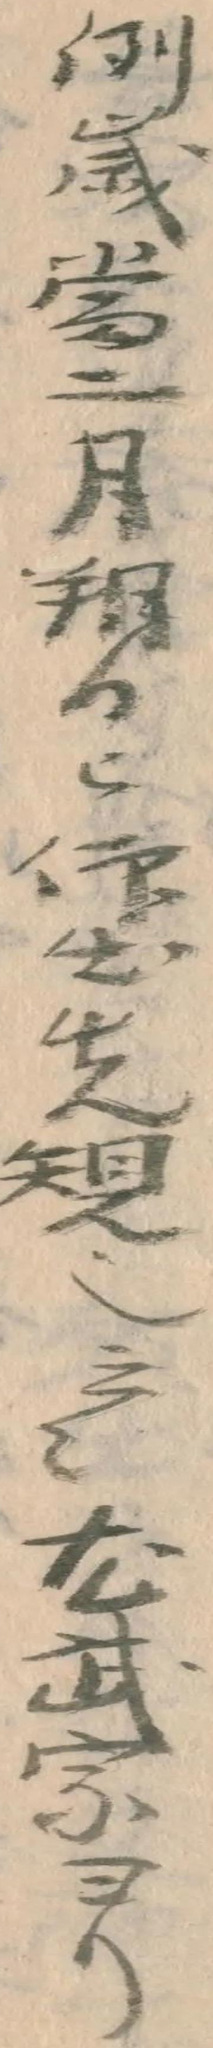例歳當二月朔日被仰出先規也云〻尤武家ヨリ
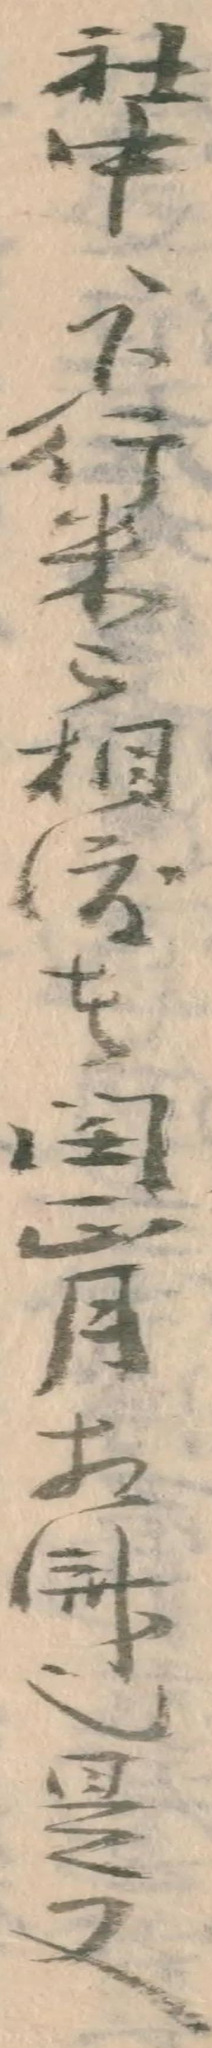社中へ下行米被相渡者閏正月相済也是又
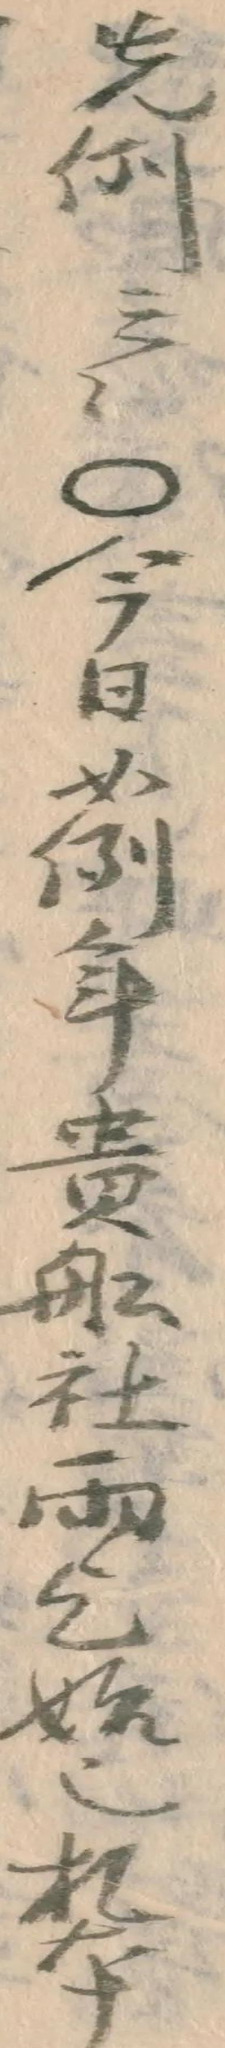先例云〻○今日如例年貴船社雨乞始也札本
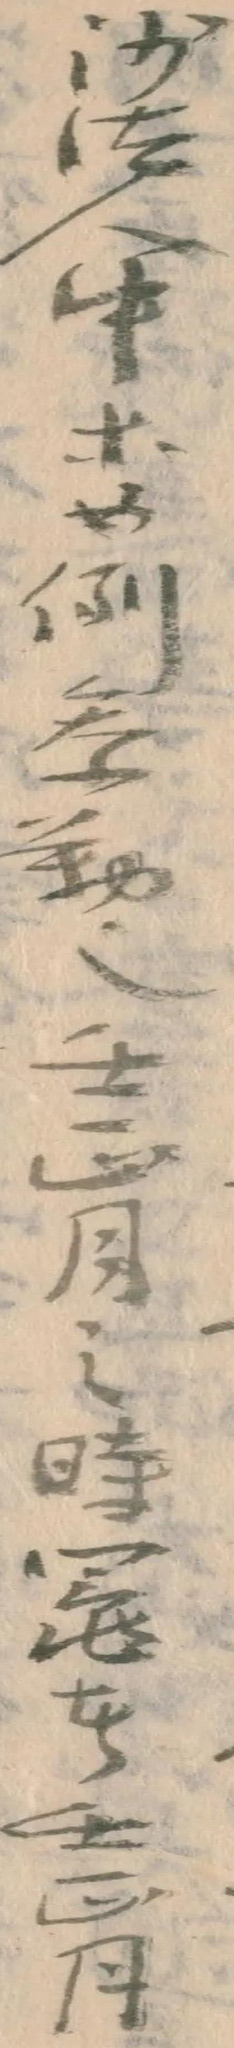沙汰人中等如例参勤也壬正月之時籤者壬正月
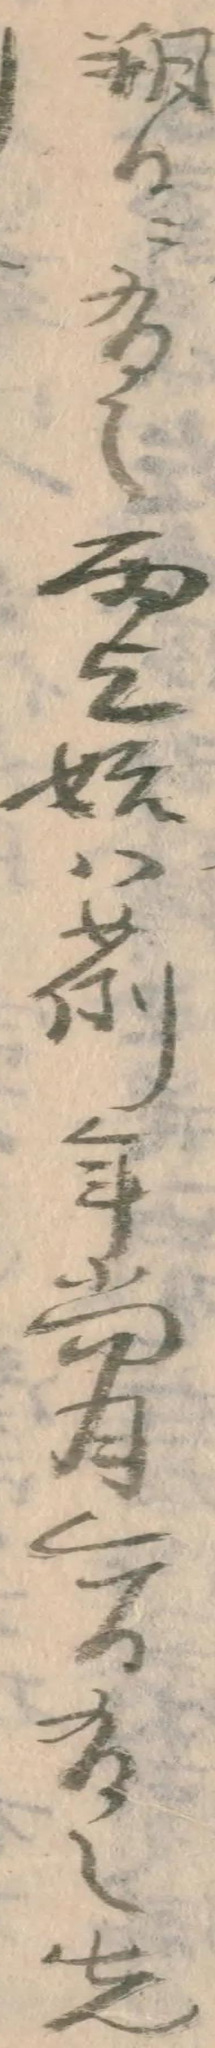朔日ニ有之雨乞始ハ如例年當月今日有之先
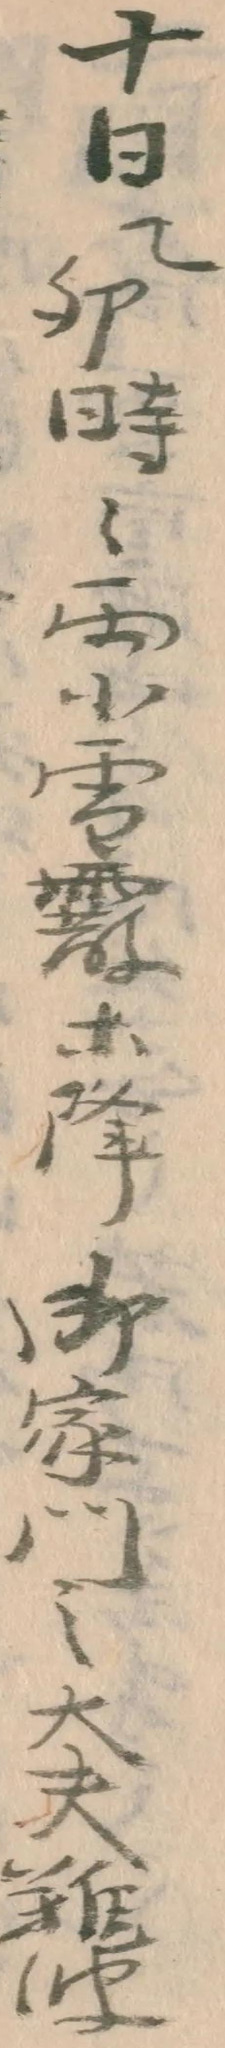十日乙卯時々雨小雪霰等降御家門之大夫難波
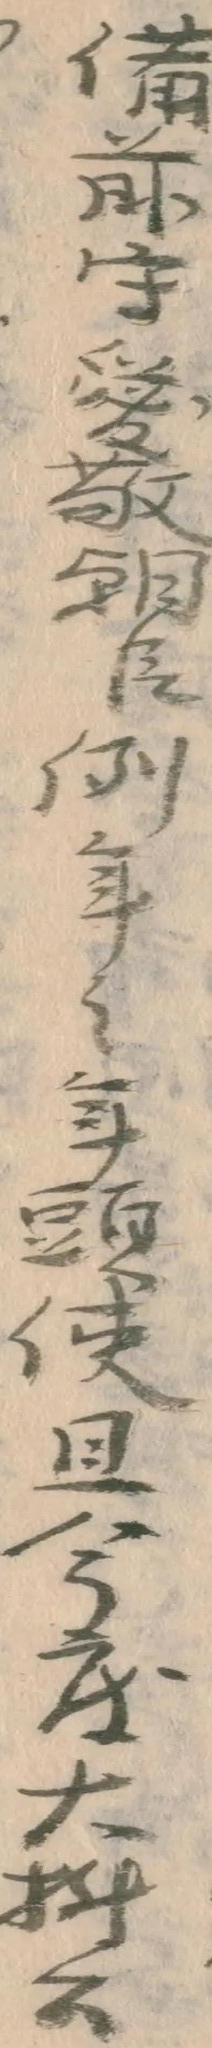備前守愛敬朝臣例年之年頭使且今度大将公
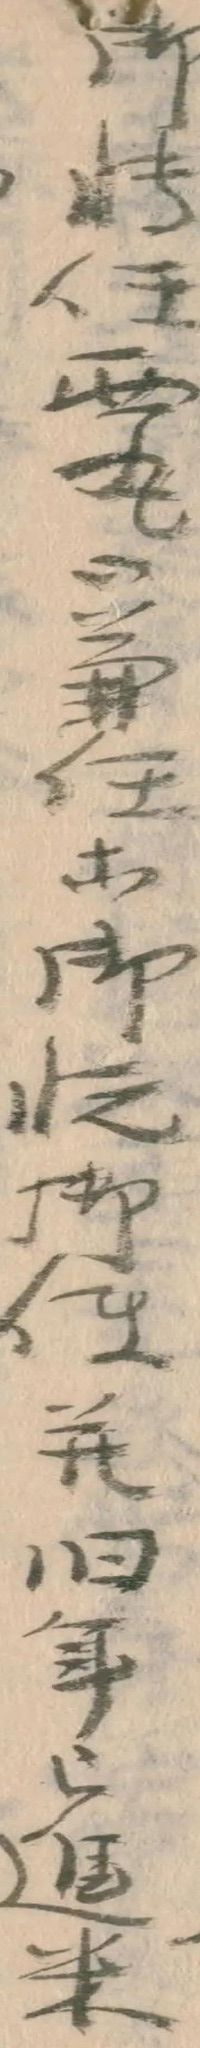御転任西丸御兼任等御祝御使并旧年被進米
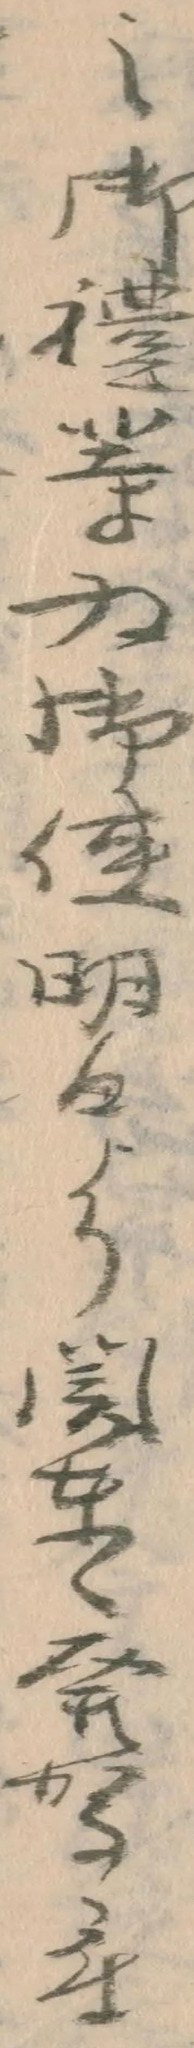之御禮輩為御使明日より関東へ発駕ニ付
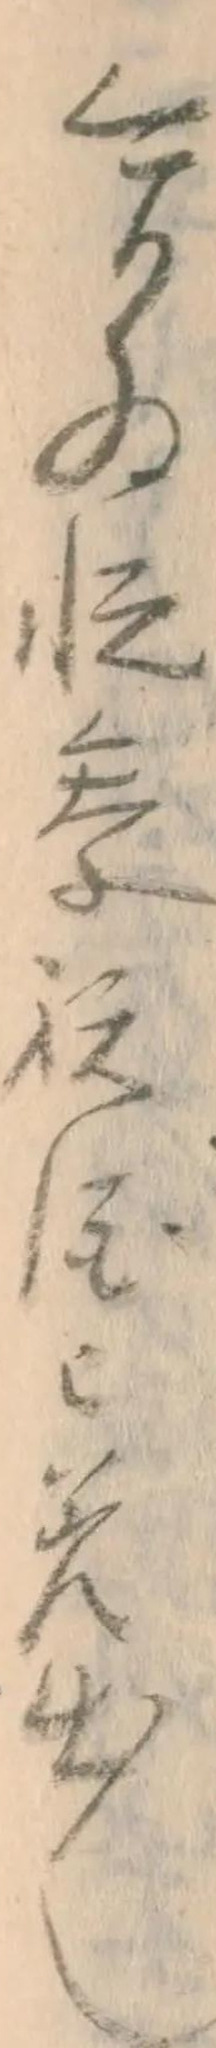今日為悦参祝儀被差出候
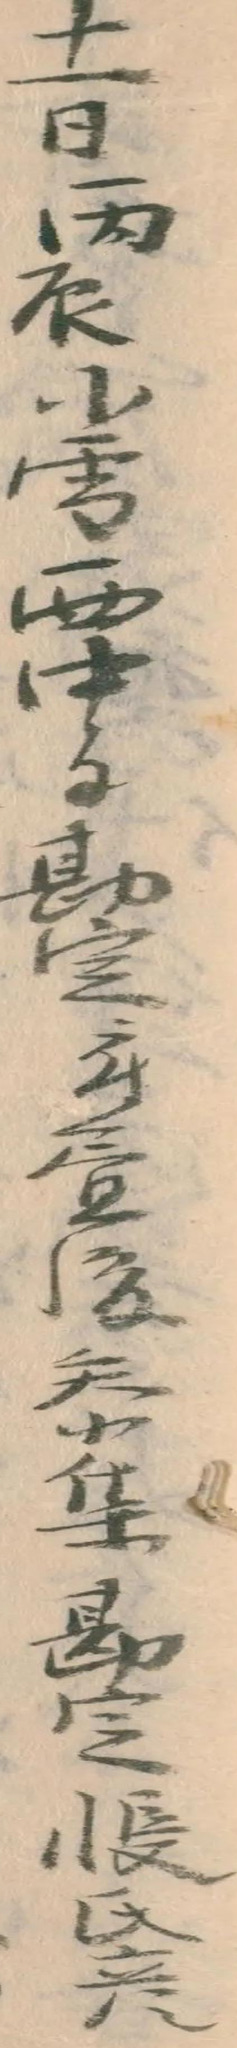十一日丙辰小雪西中手勘定ニ付昼後参集勘定帳氏彦
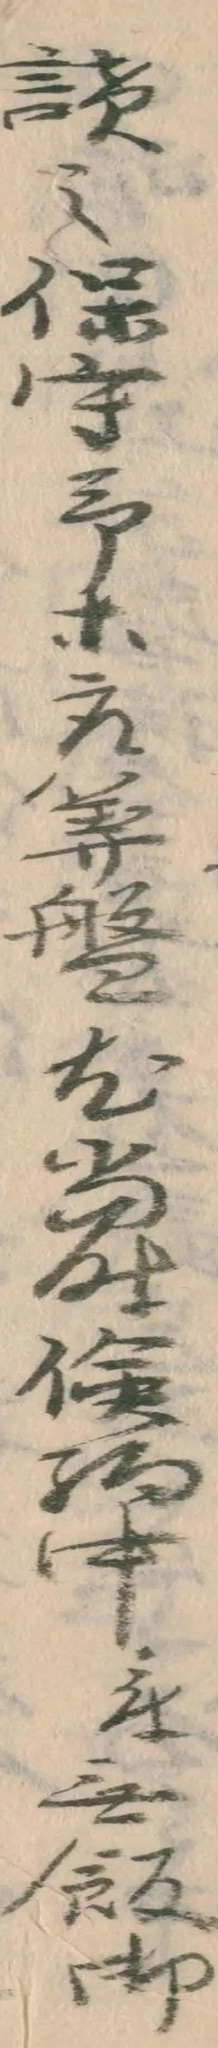讀之保守予等取算盤尤當時倹約中ニ付無飯御
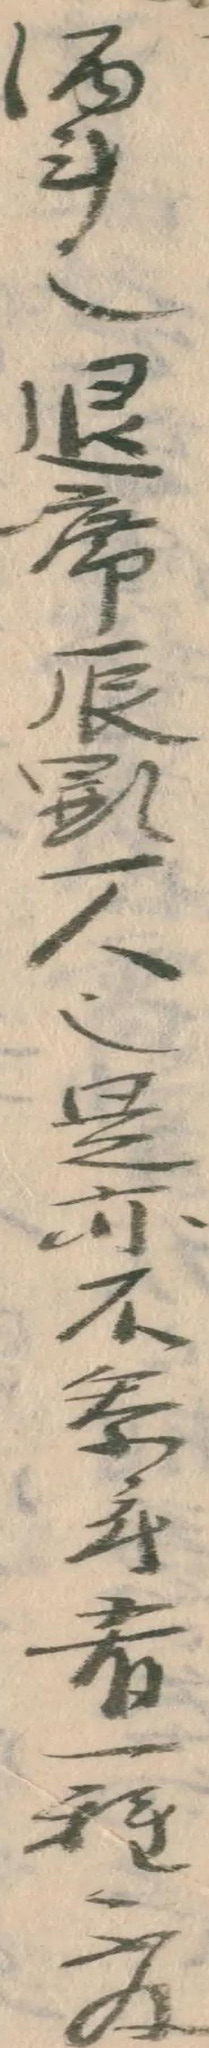酒斗也退席辰顕一人也是亦不参ニ付肴一種不及
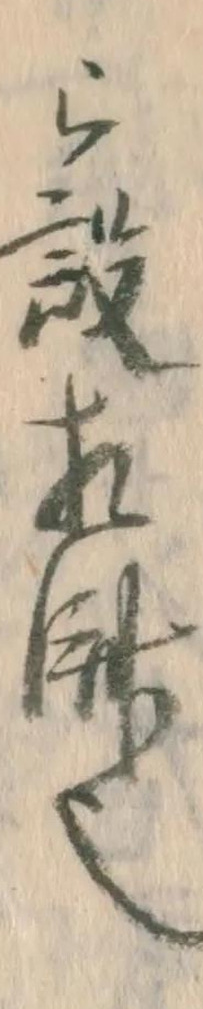被設相済也
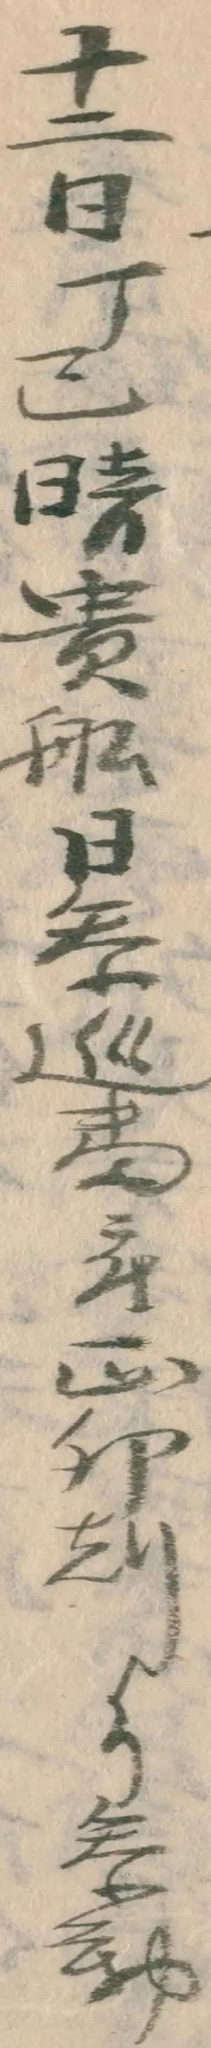十二日丁巳晴貴船日参巡番ニ付正卯刻より参勤
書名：賀茂社記録. 第63冊
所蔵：国立国会図書館 National Diet Library, JAPAN
